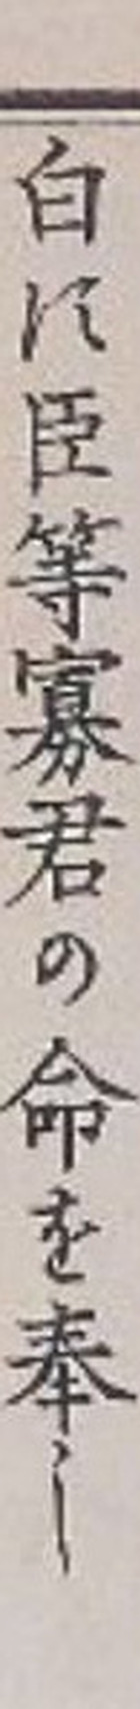白す臣等寡君の命を奉し
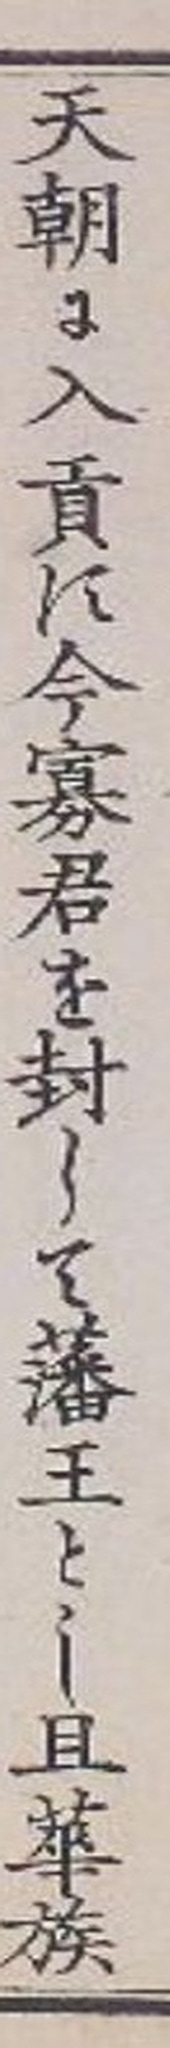天朝に入貢す今寡君を封して藩王とし且華族
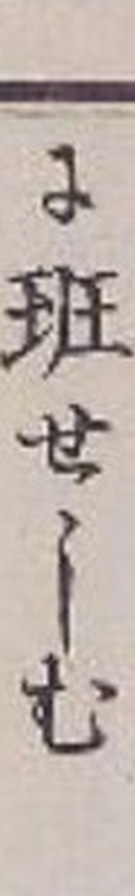に班せしむ
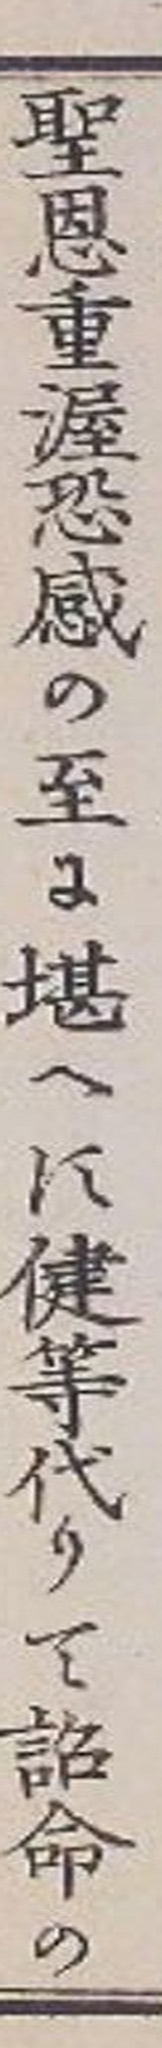聖恩思渥恐感の至に堪へす健等代りて詔命の
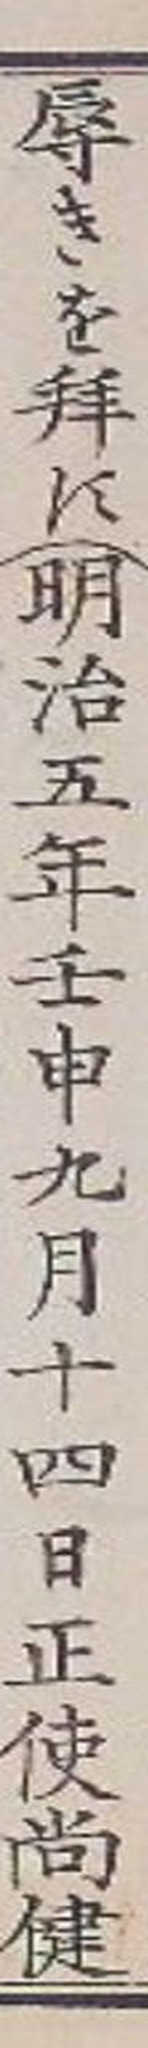辱きを拝す(明治五年壬申九月十四日正使尚健
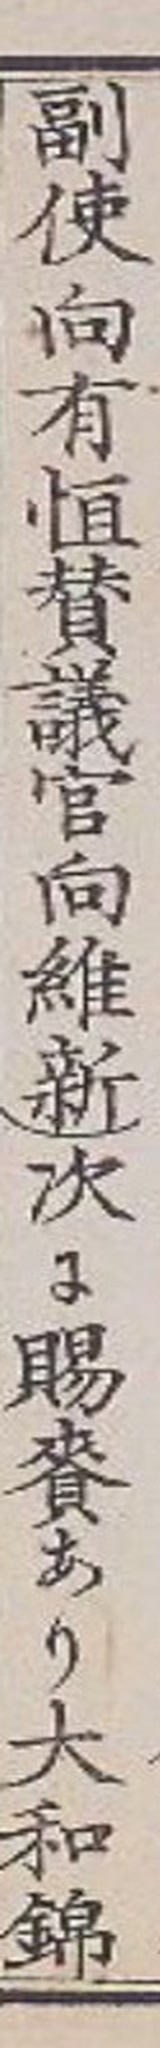副使向有恒賛議官向維新)次に賜賚あり大和錦
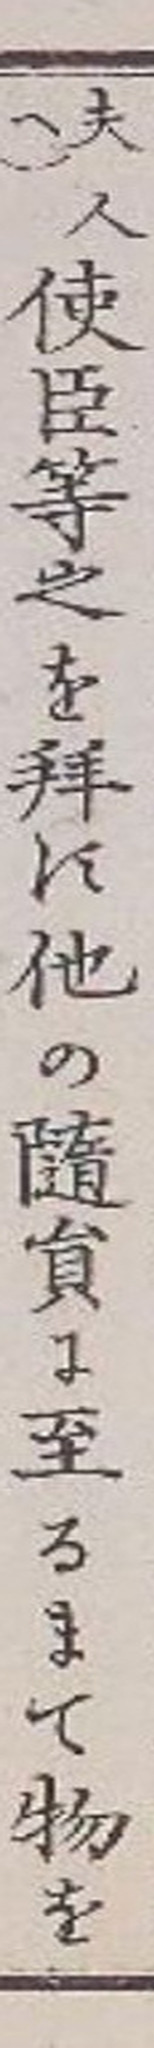夫人へ)使臣等之を拝す他の隋員に至るまて物を
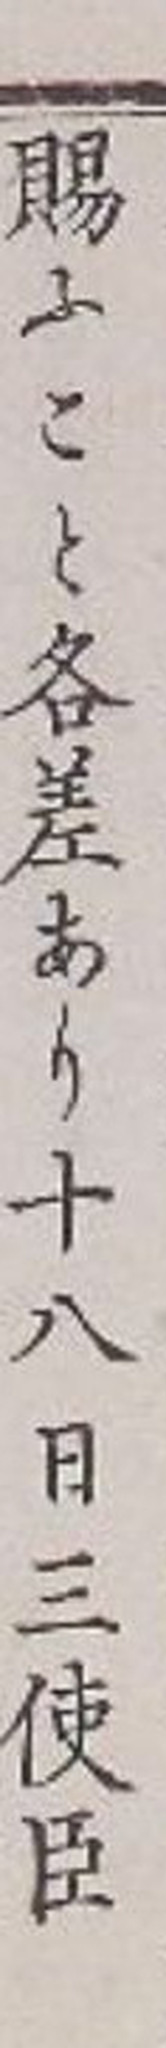賜ふこと各差あり十八日三使臣
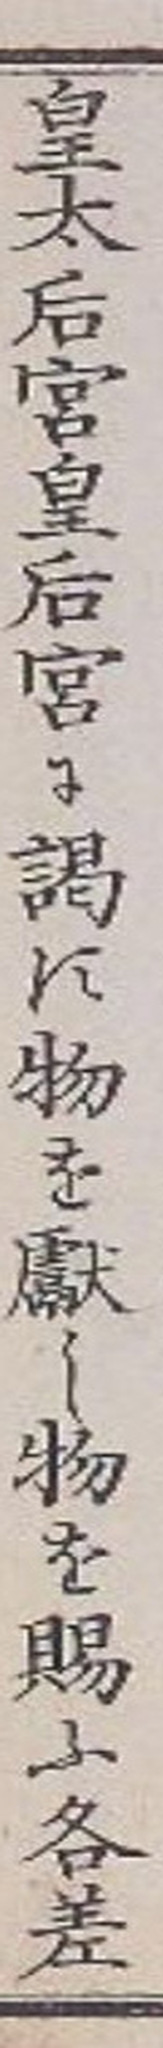皇太后宮皇后宮に謁す物を献し物を賜ふ各差
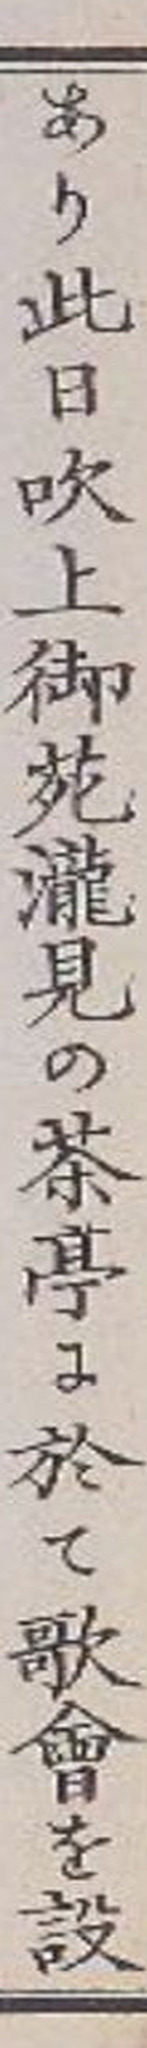あり此日吹上御苑瀧見の茶亭に於て歌会を設
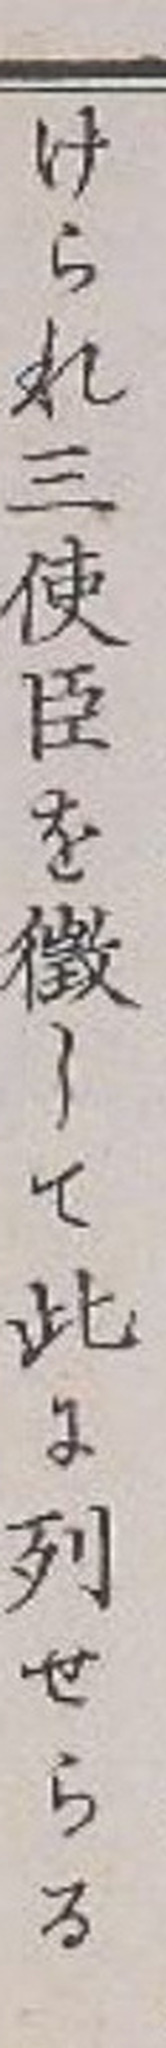けられ三使臣を徴して此に列せらる
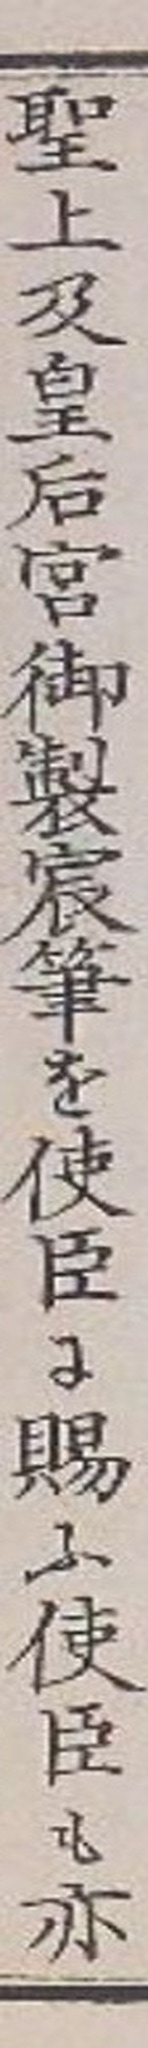聖上及皇后宮御製宸筆を使臣に賜ふ使臣も亦

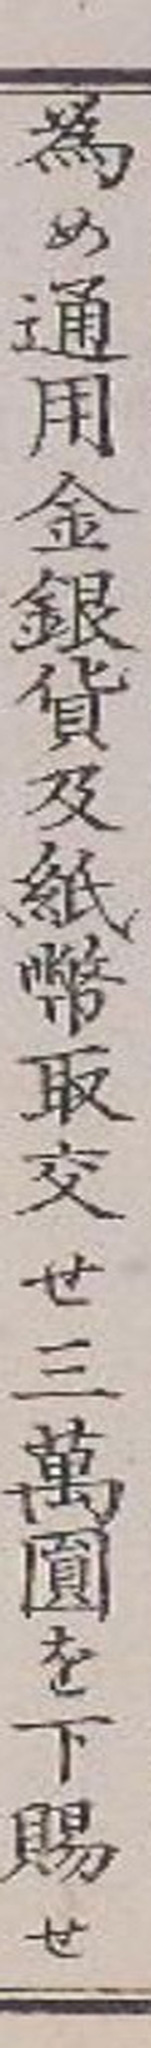為め通用金銀貨及紙幣取交せ三万円を下賜せ
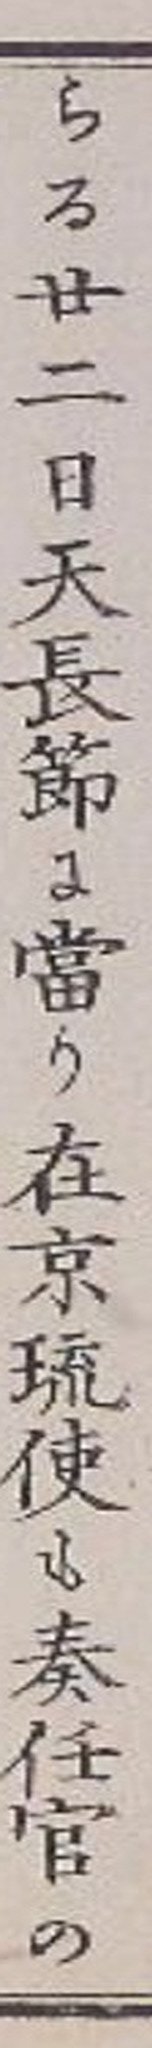らる廿二日天長節に当り在京琉使も奏任官の
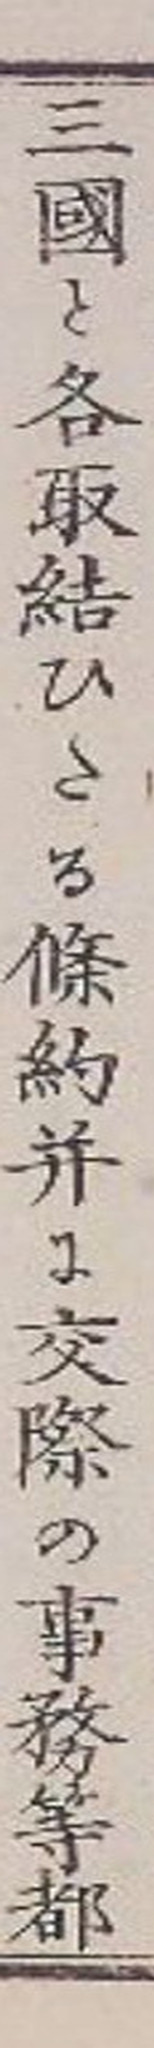三国と各取結ひたる条約並に交際の事務等都
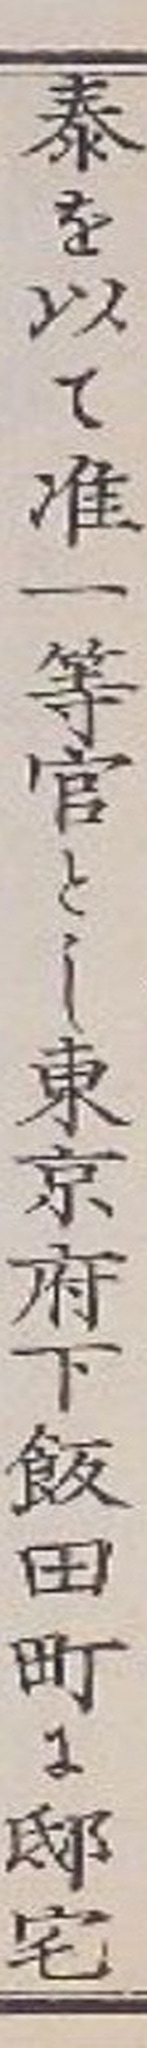泰を以て准一等官とし東京府下飯田町に邸宅
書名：南島紀事 下
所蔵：University of the Ryukyus Library
